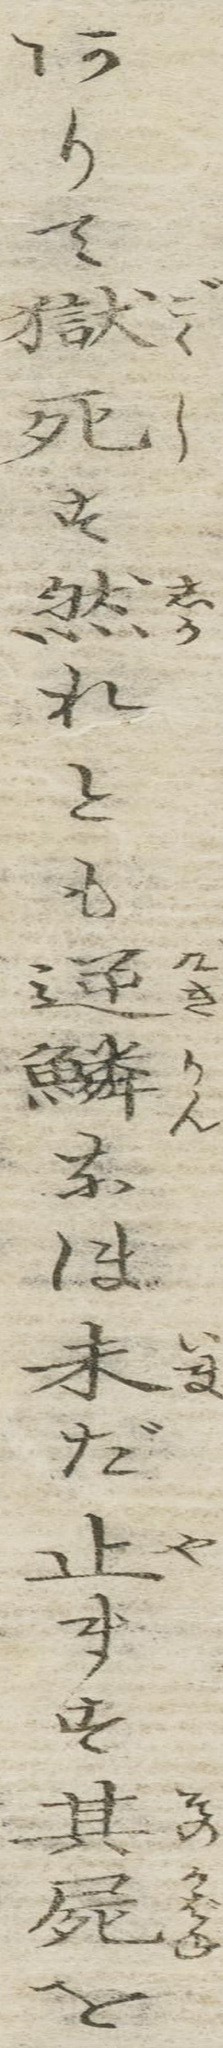ありて獄死す然れとも逆鱗なほ未だ止ます其屍を
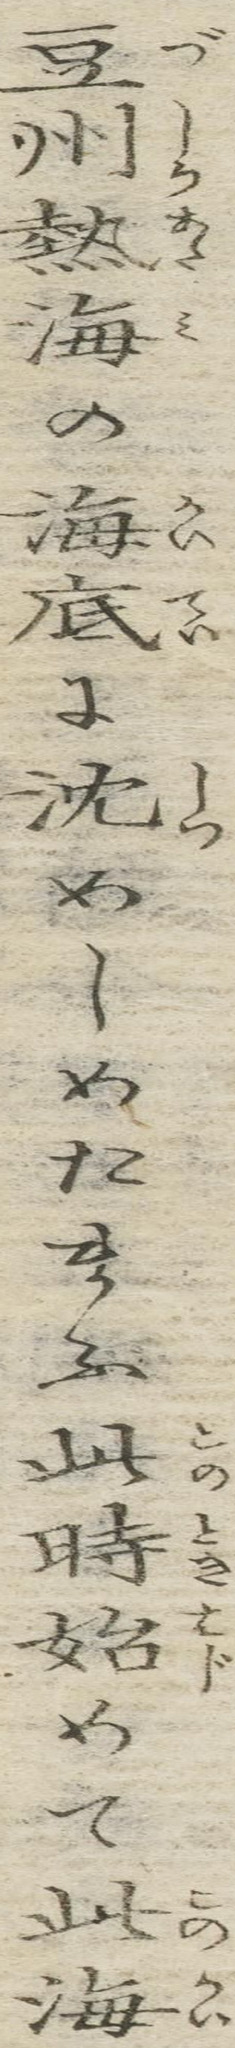豆州熱海の海底に沈めしめたまふ此時始めて此海

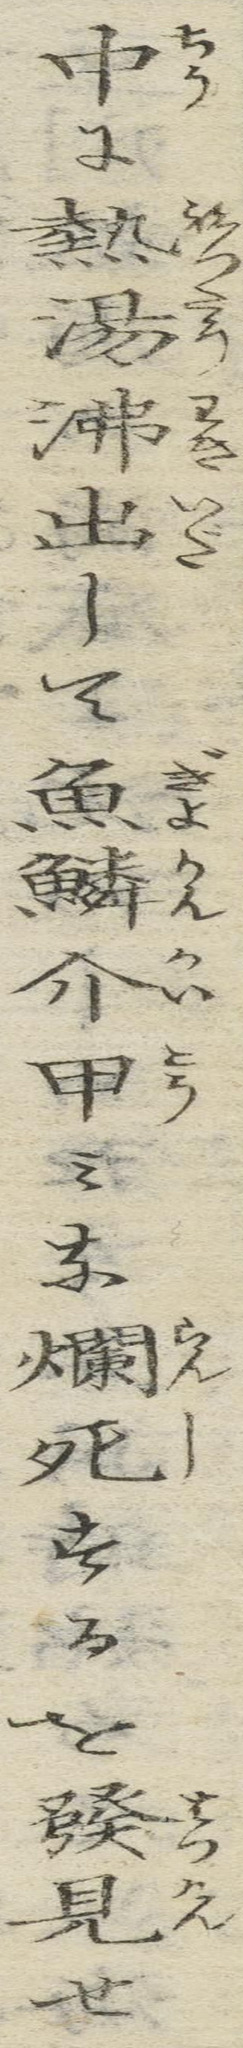中に熱湯沸出して魚鱗介甲みな爛死するを発見せ
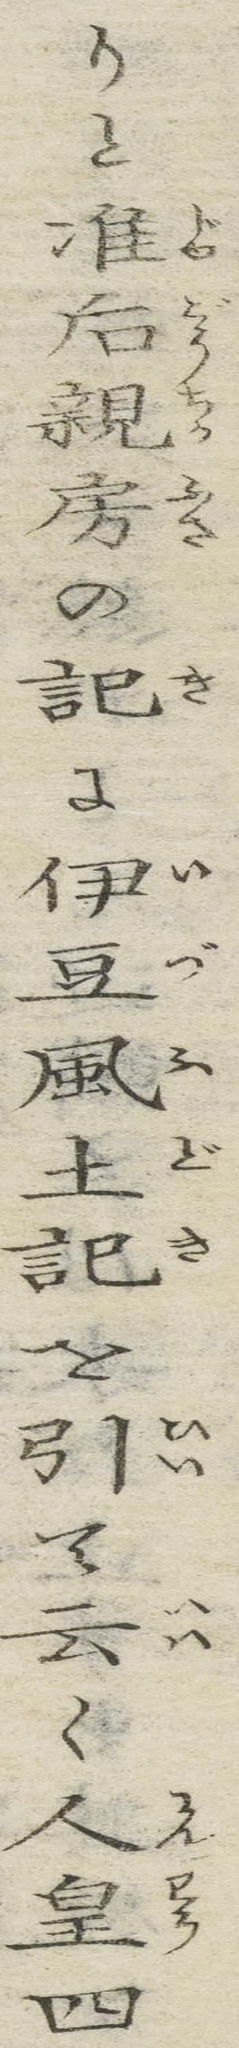りこと准后親房の記に伊豆風土記を引て云く人皇四
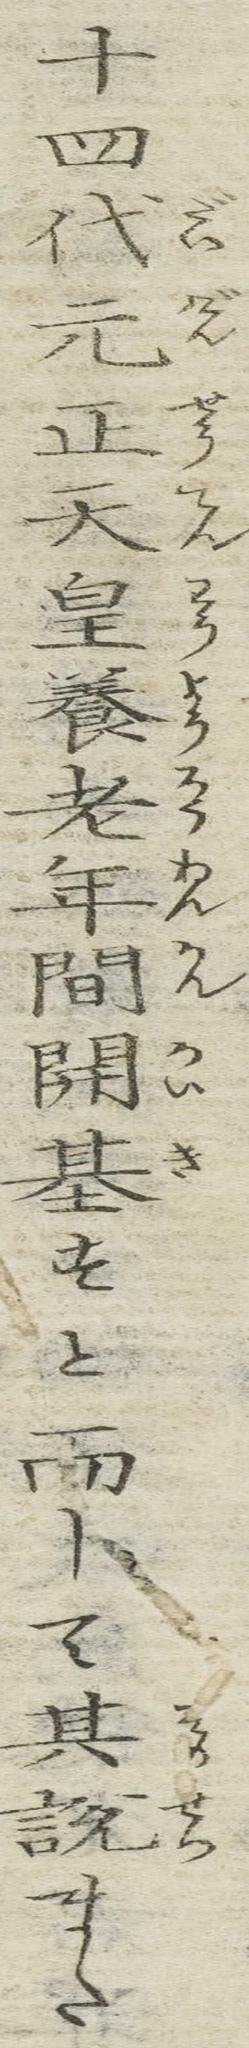十四代元正天皇養老年間開基すと而して其説また
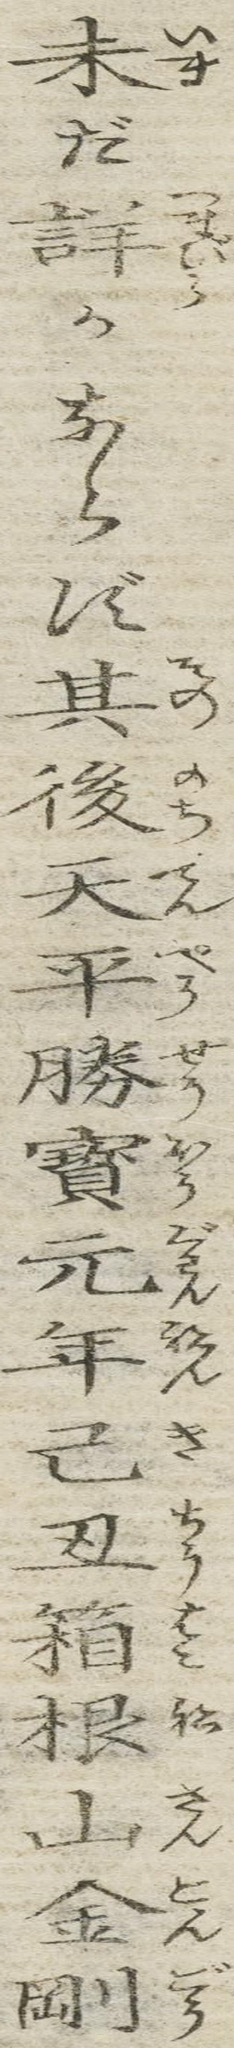未だ詳かならず其後天平勝宝元年己丑箱根山金剛
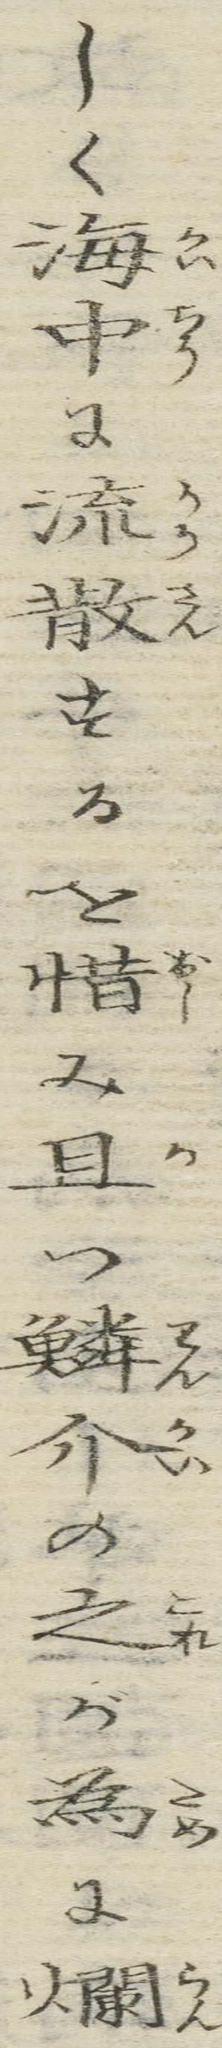しく海中に流散するを惜み且つ鱗介の之が為に爛
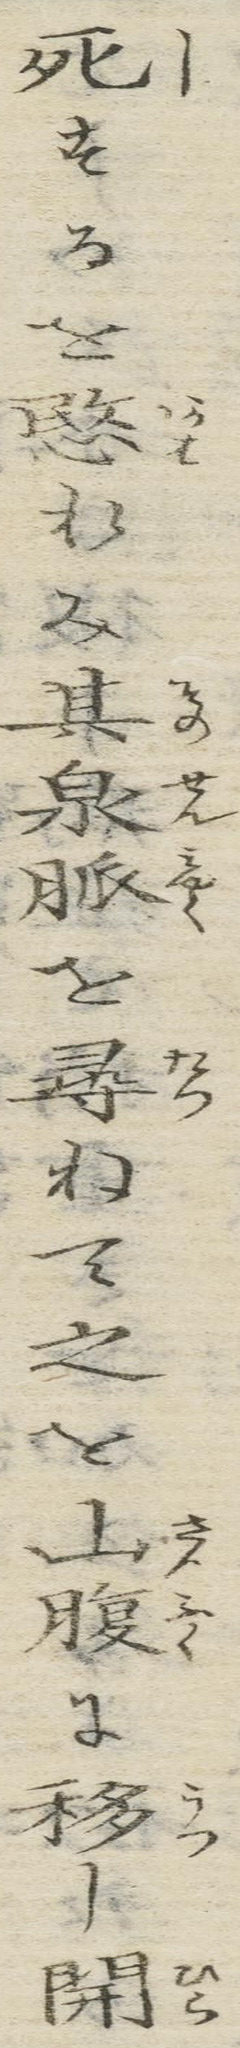死するを愍れみ其泉脈を尋ねて之を山腹に移し開
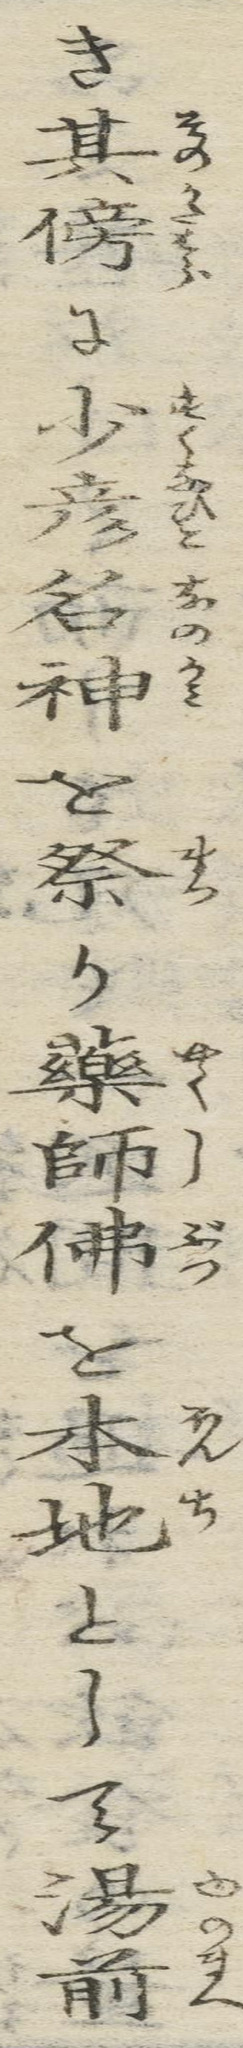き其傍に少彦名神を祭り薬師仏を本地として湯前
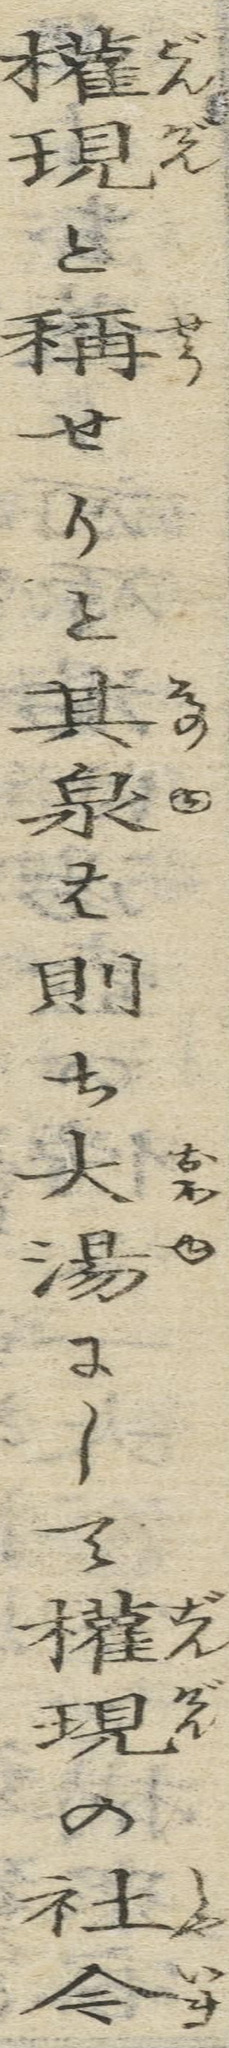権現と称せりと其泉は則ち大湯にして権現の社今
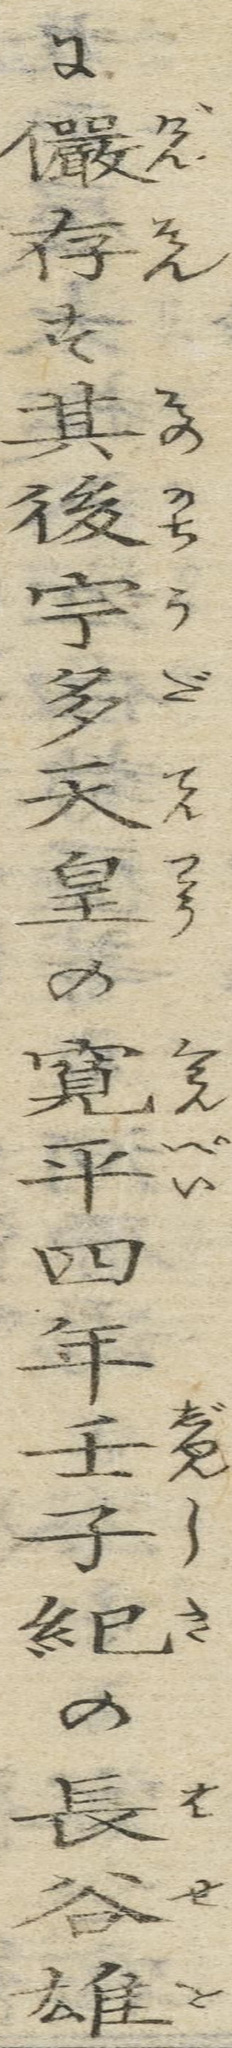に儼存す其後宇多天皇の寛平四年壬子紀の長谷雄
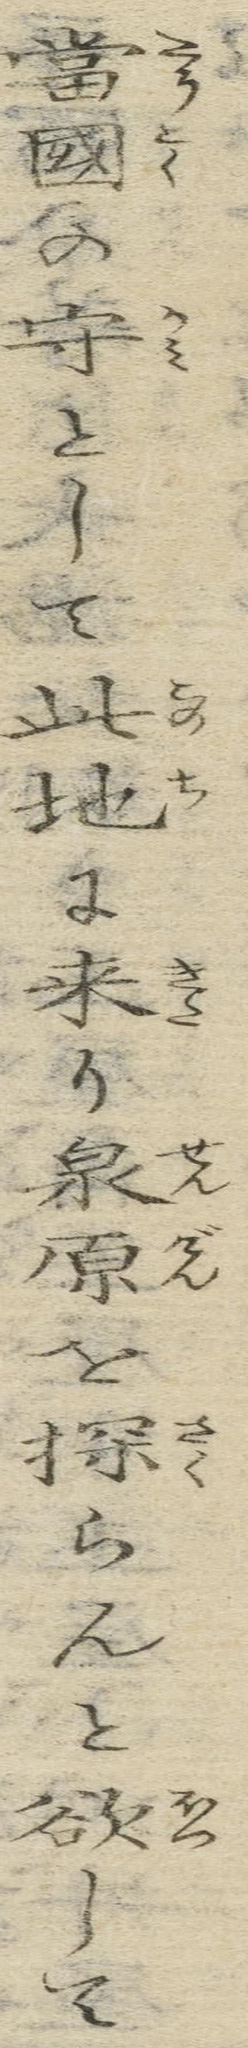当国の守として此地に来り泉原を探らんと欲して
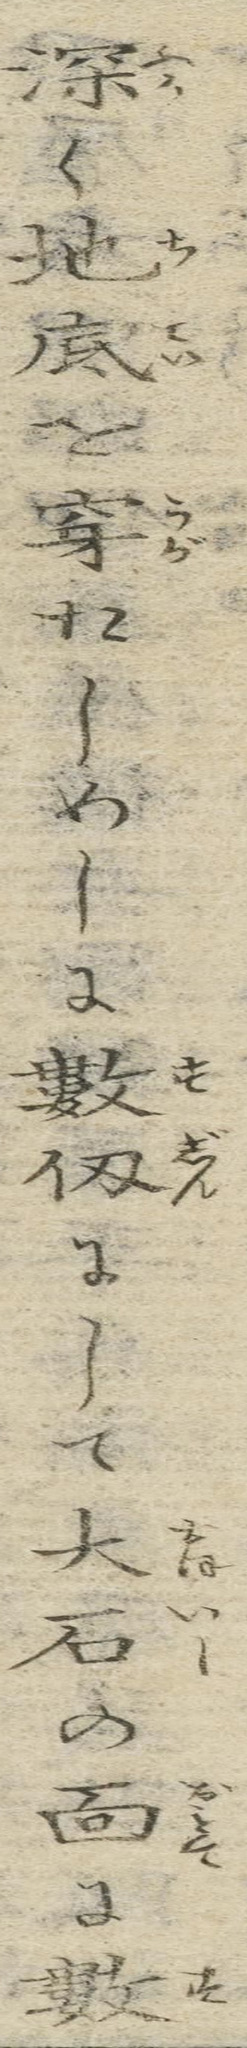深く地底を穿たしめしに数仞にして大石の面に数
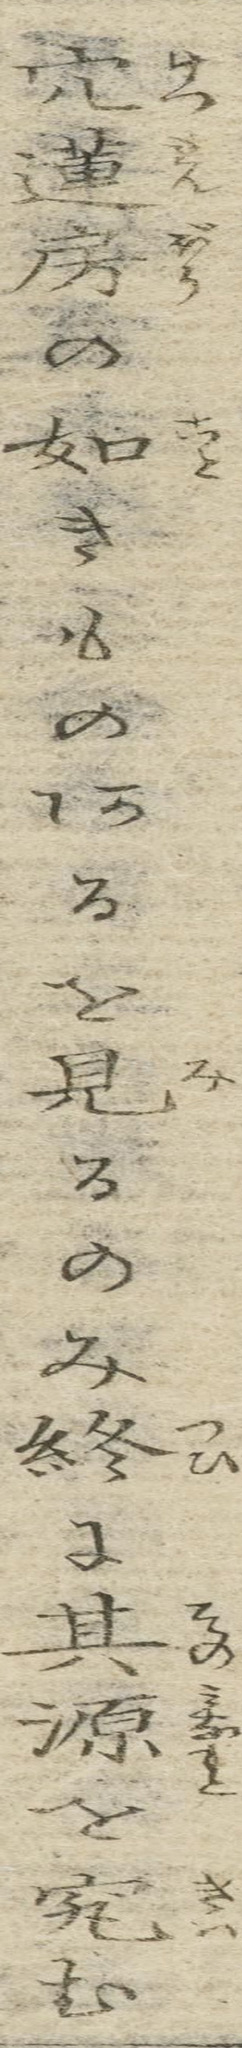穴蓮房の如きものあるを見るのみ終に其源を究む
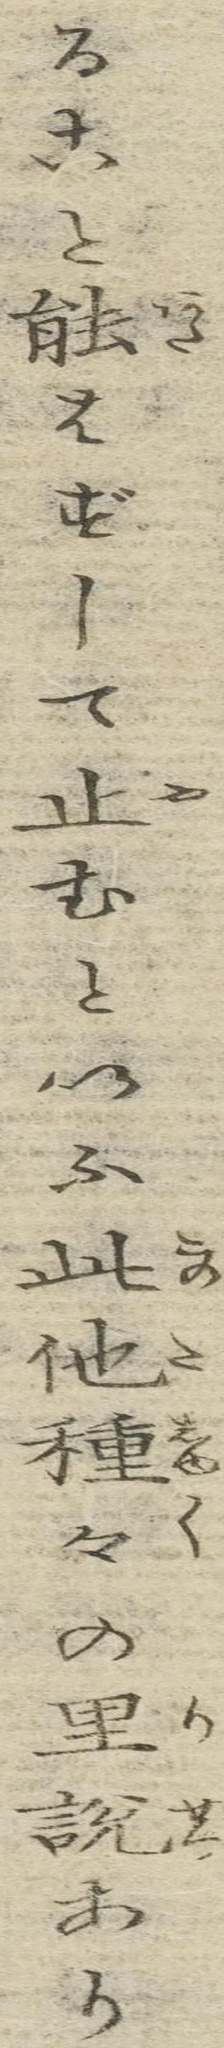ること能はずして止むといふ此他種々の里説あり
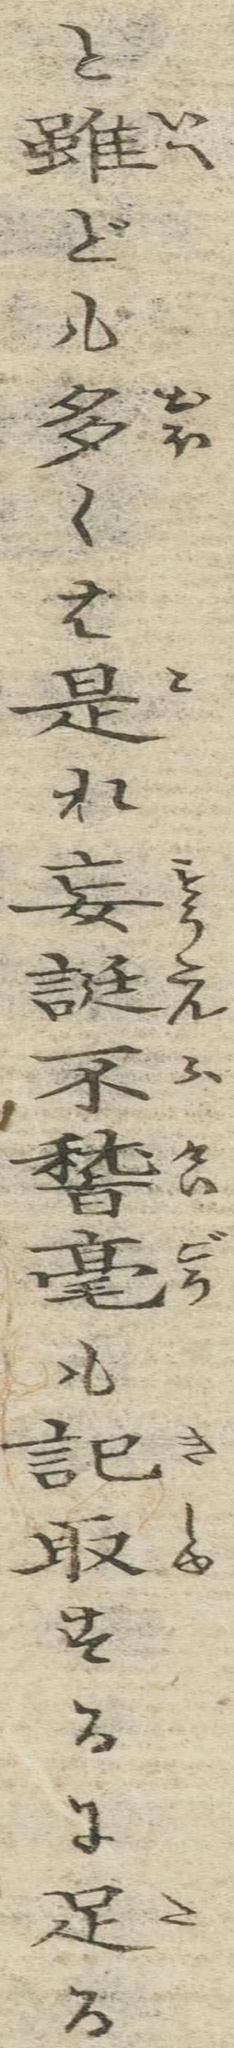と雖ども多くは是れ妄誕不稽毫も記取するに足る
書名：豆州熱海誌　完
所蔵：東京大学地震研究所図書室 Earthquake Research Institute Library, The University of Tokyo, JAPAN
